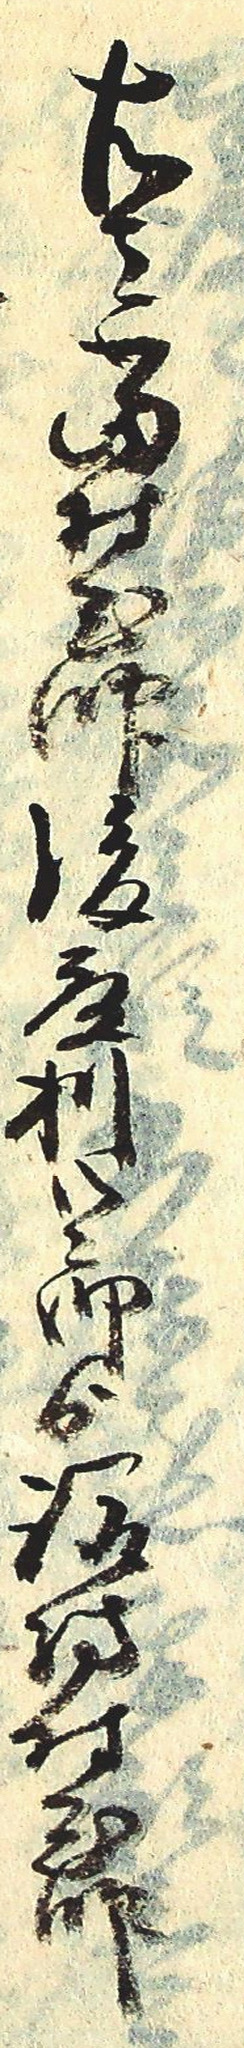右は当村玉師後藤利八郎ゟ諏訪村玉師
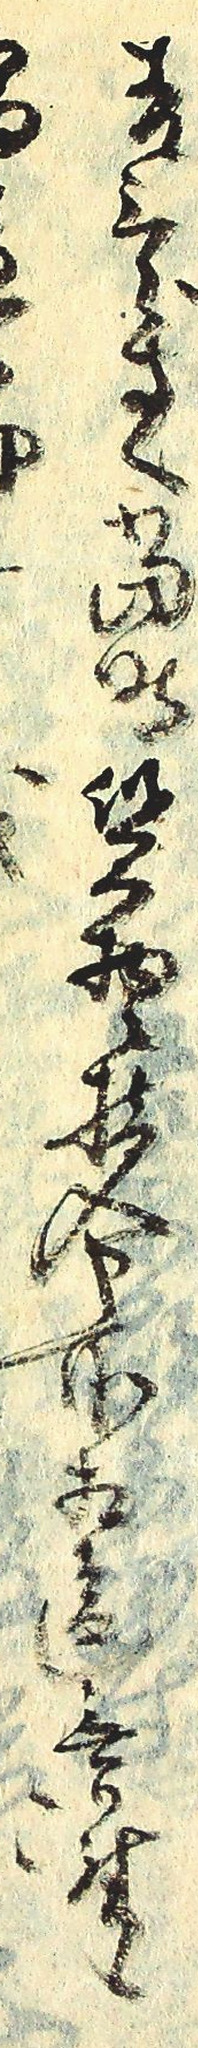吉三郎方へ当時質物に指入申所相違無御座候
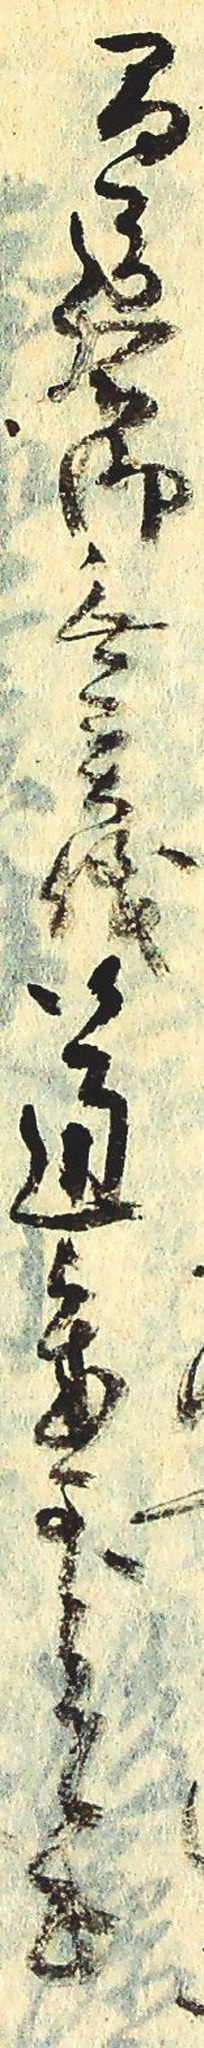間道筋無異儀御通被成可被下候以上
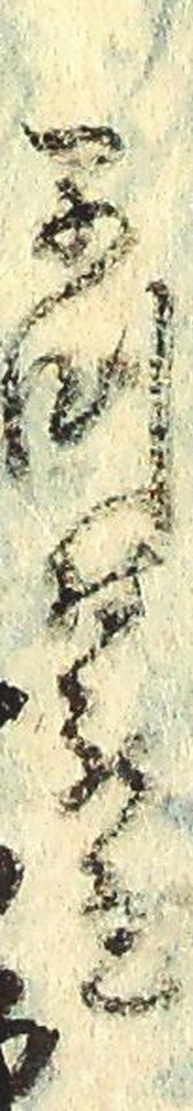早淵村庄屋
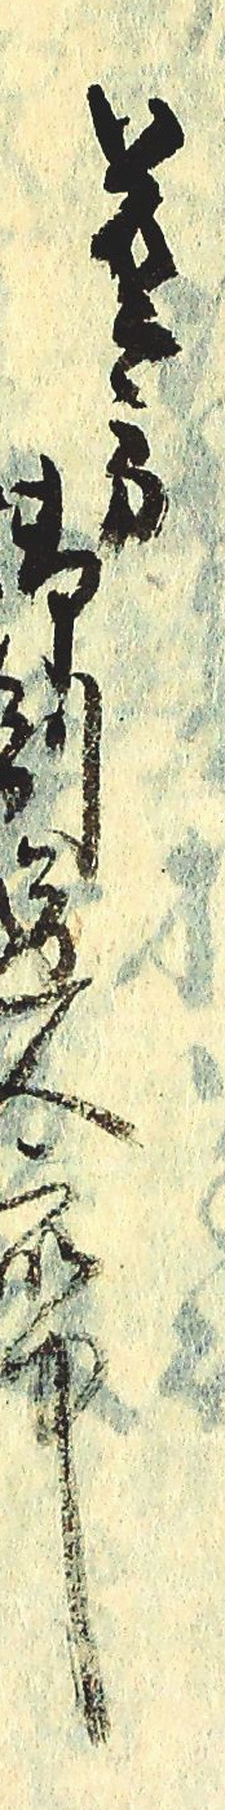御制道人衆中
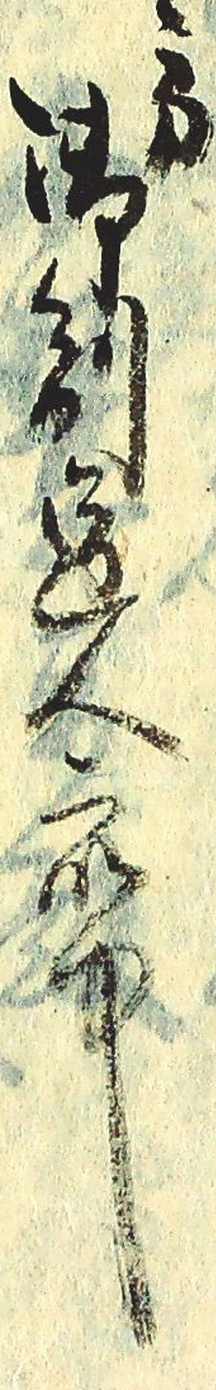御制道人衆中
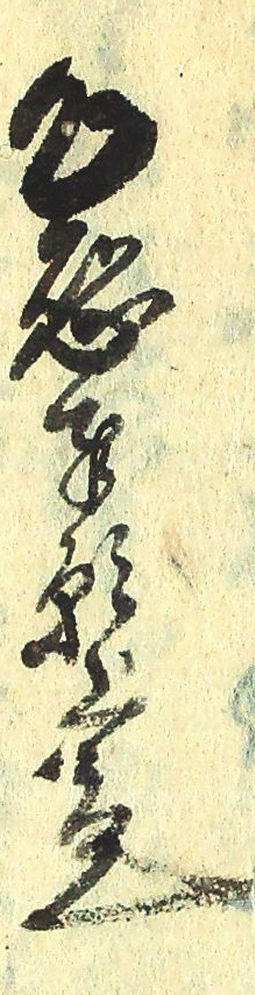乍恐奉願上覚
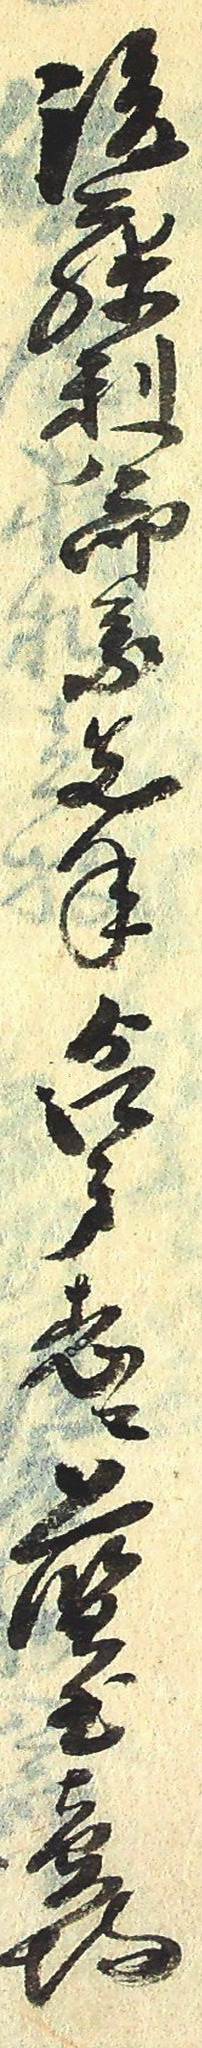後藤利八郎儀先年ゟ江戸表え藍玉売場
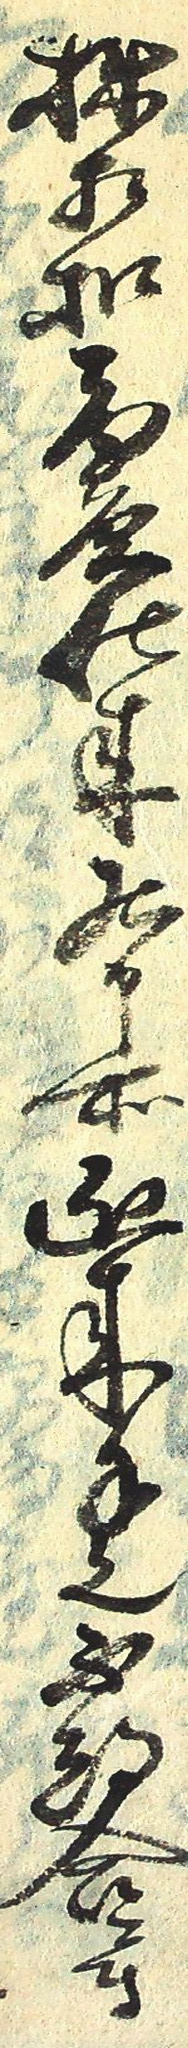株相扣商売仕来居申所近来手元不都合に付
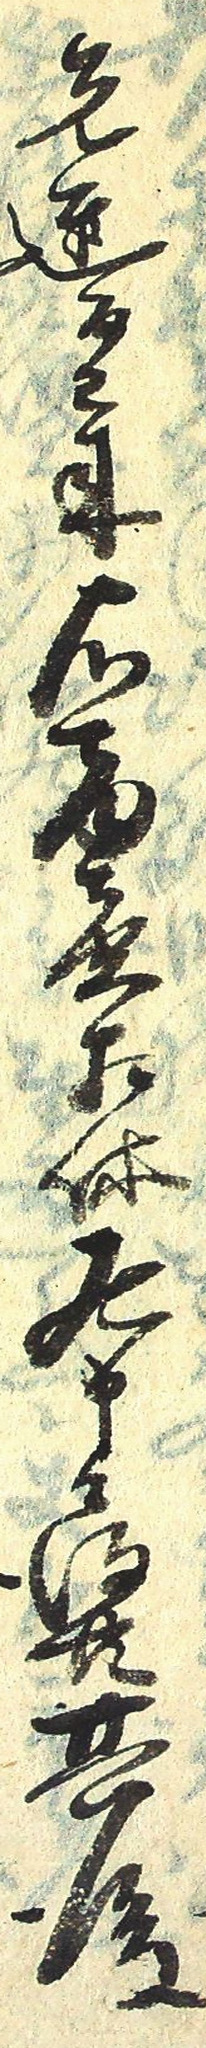先達て已来右商売相休居申候得共其後
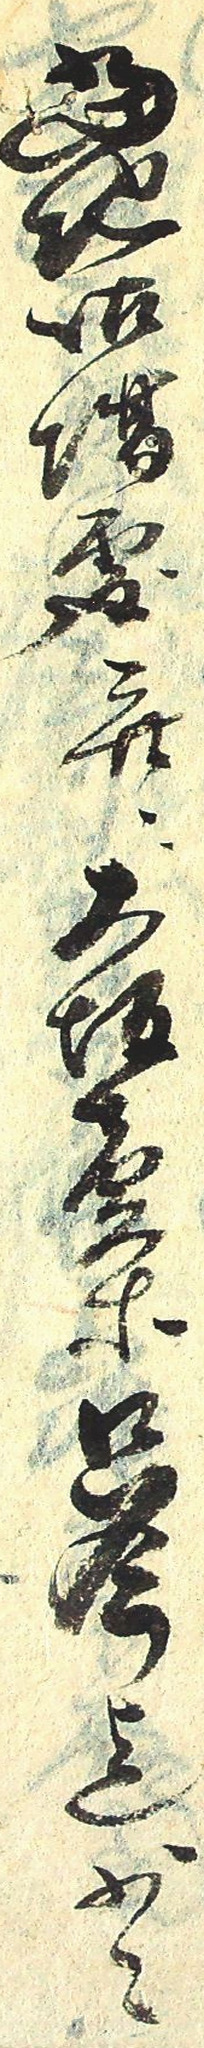当地御場処并に大坂売等只今迄少々
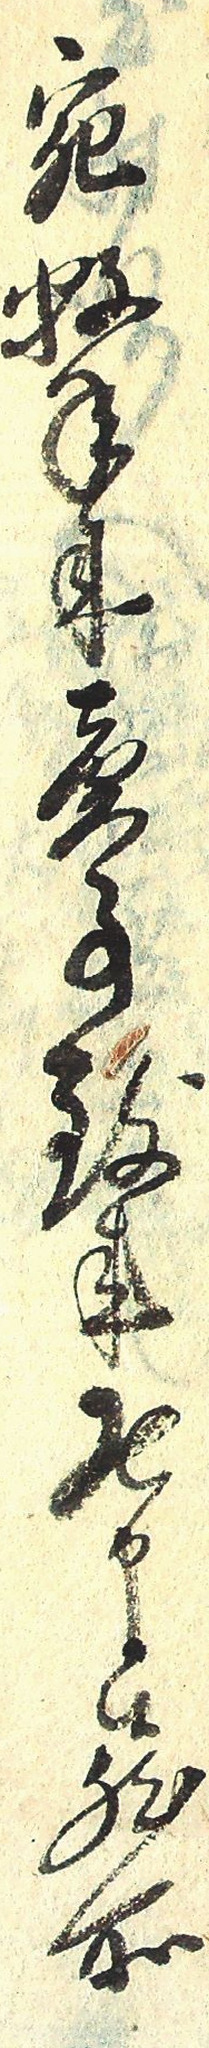宛数年来売事致来居申候然所

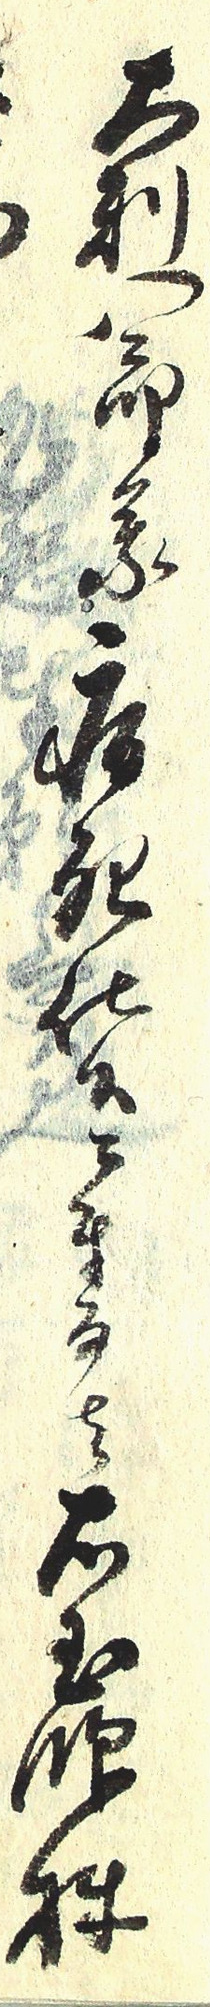右利八郎義病死仕候に付ては右玉師株
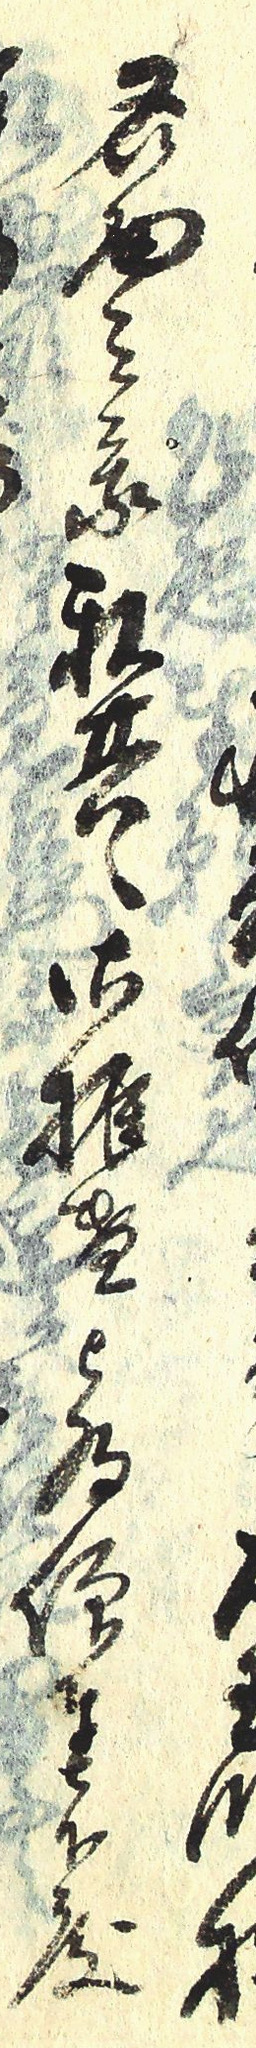名面之義私共へ御振替被為仰付被下度
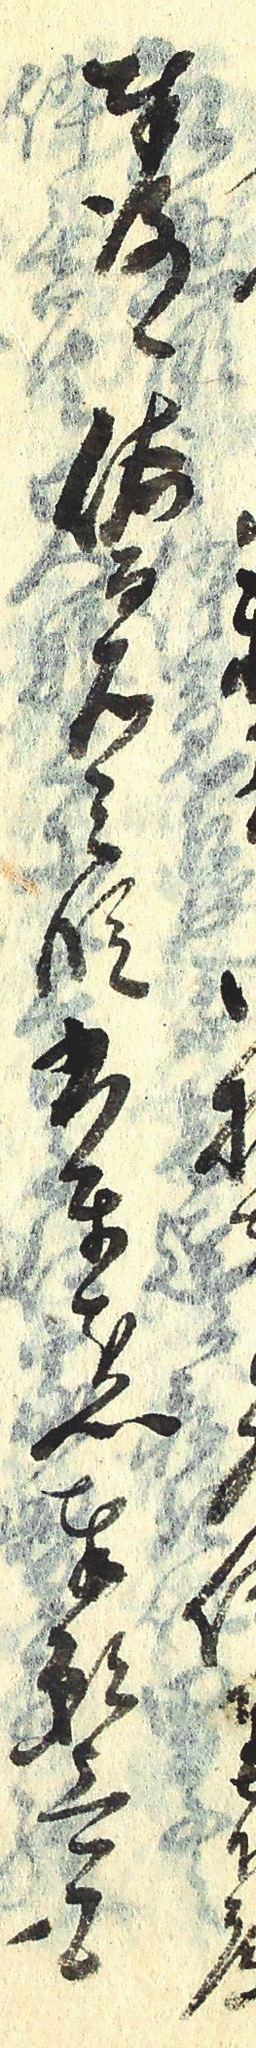奉存候依て右之段書付を以奉願上候以上
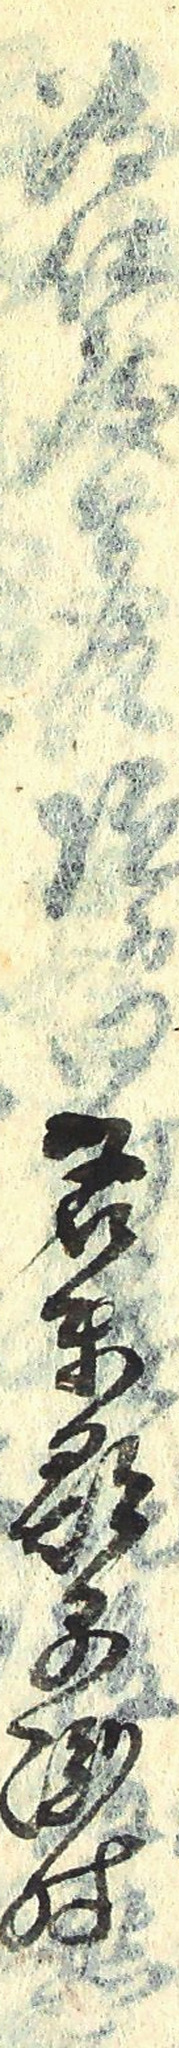名東郡早淵村
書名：諸御願書控(弐番）
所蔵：鳴門教育大学 Naruto University of Education
